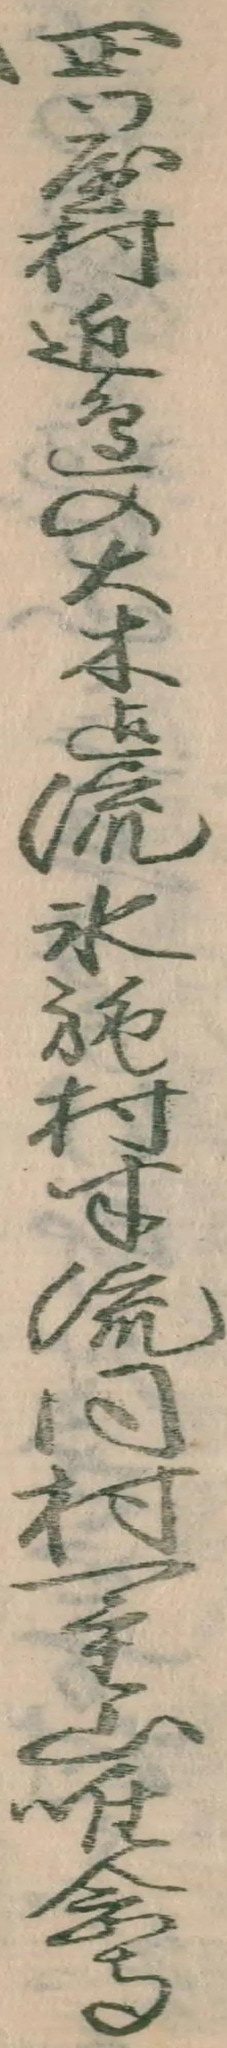四ツ屋村近辺の大木迄流氷施村半流同村一重山唯念寺
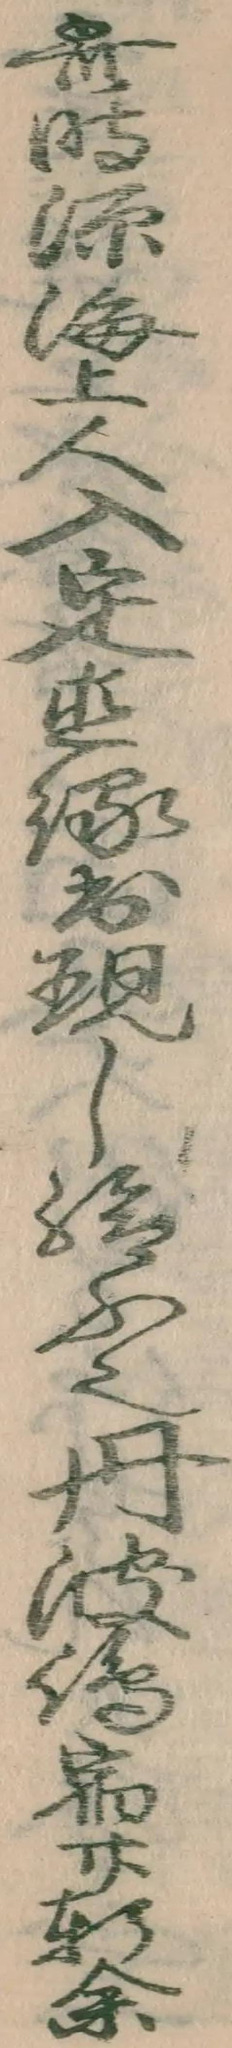此時源海上人入定直縁出現し給ふ也丹波嶋宿廿軒余
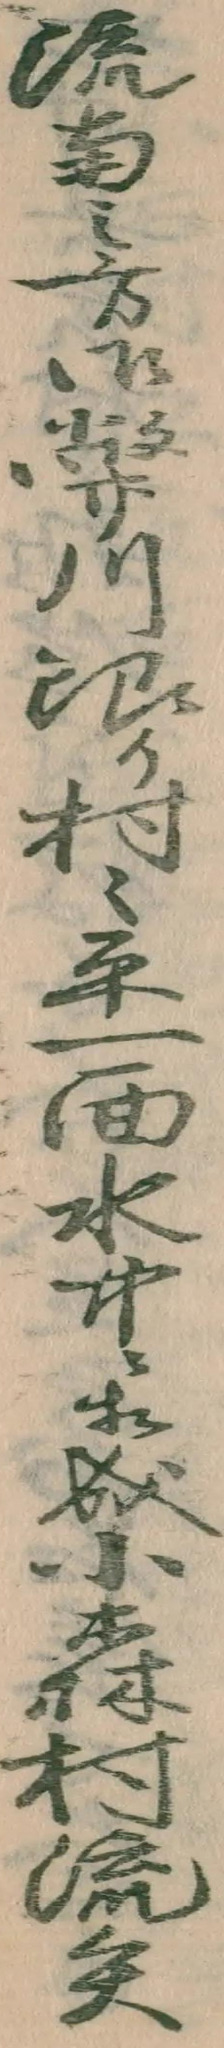流南之方御弊川限り村〻平一面水中ニ相成小森村流失
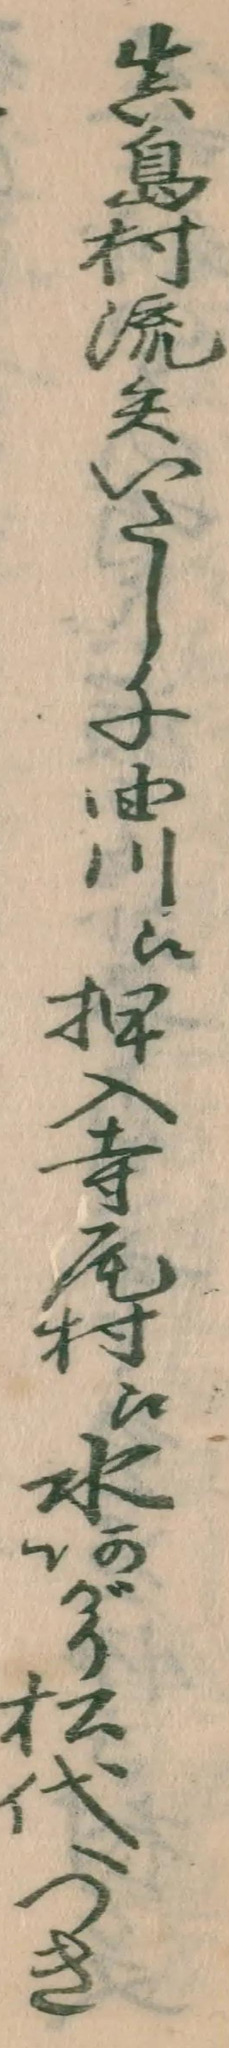真島村流失いたし千曲川え押入寺尾村え水あがり松代へつき
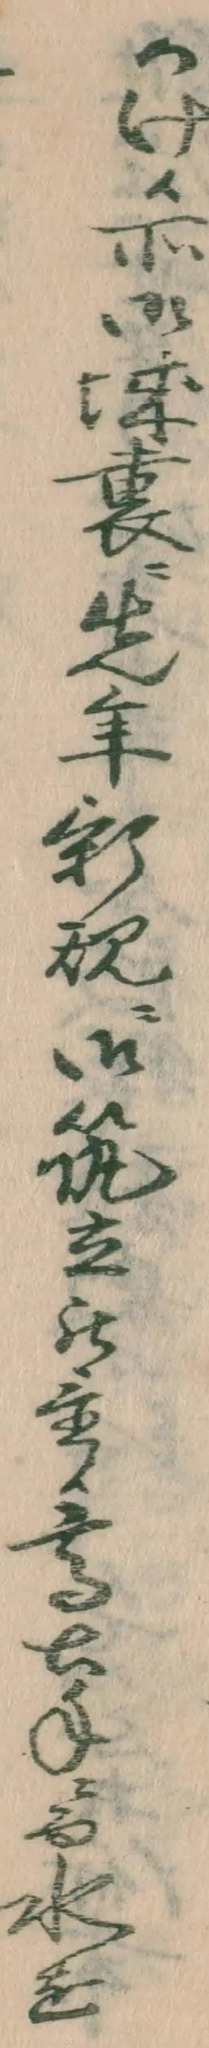かけ候所御城裏ニ先年新規ニ御筑立被置候高土手ニ而水を
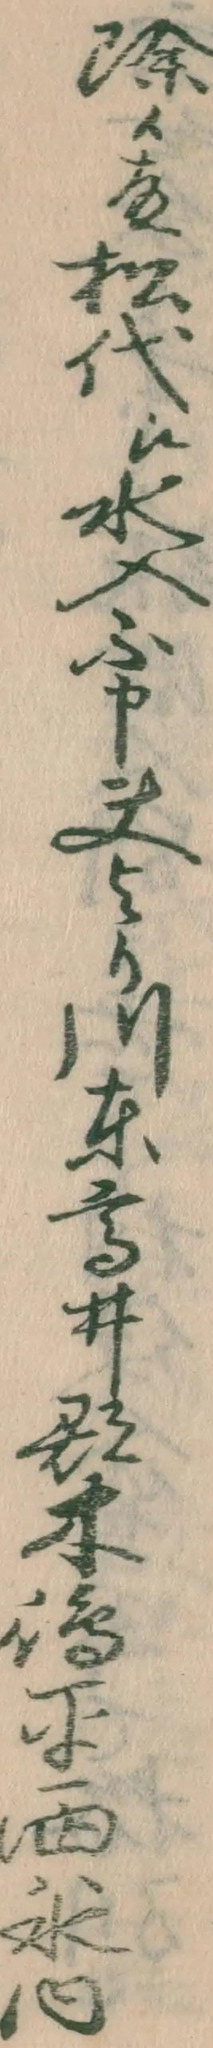除候故松代え水入不申夫より川東高井郡木嶋平西は水内
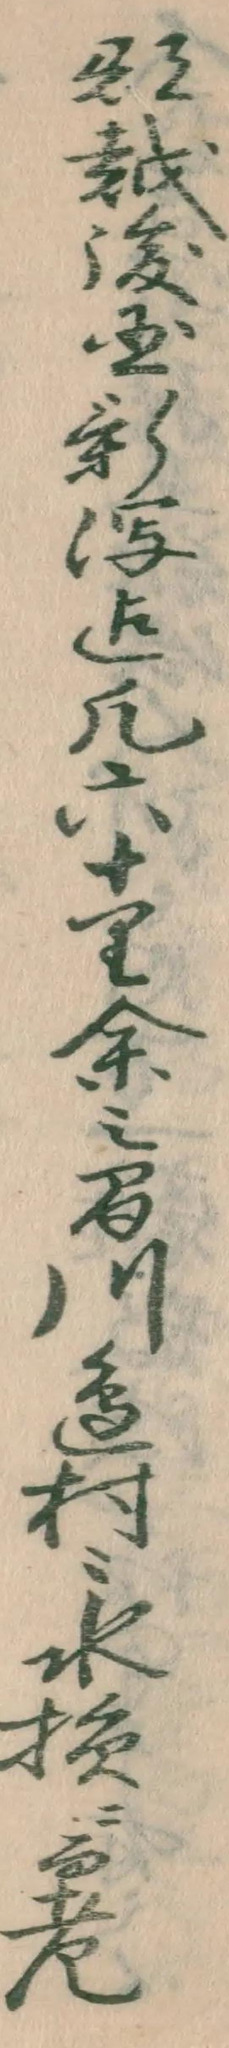郡越後国新潟迄凡六十里余之間川辺村〻水損ニ而も老
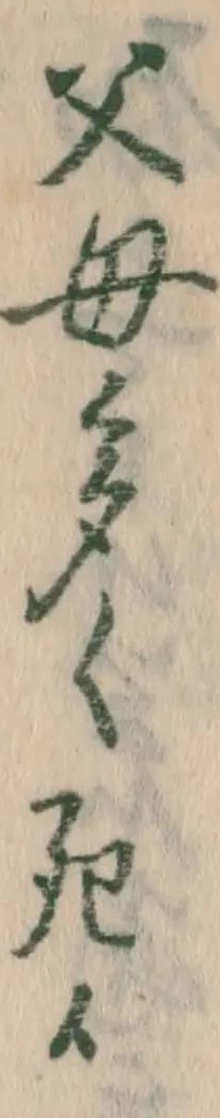父母多く死候
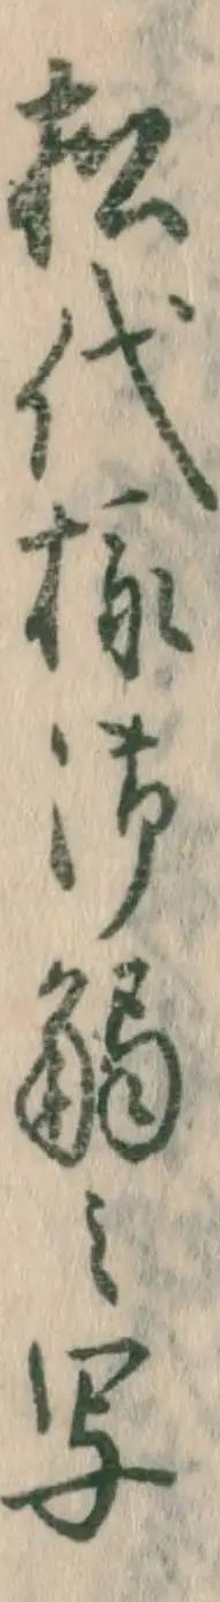松代様御触之写
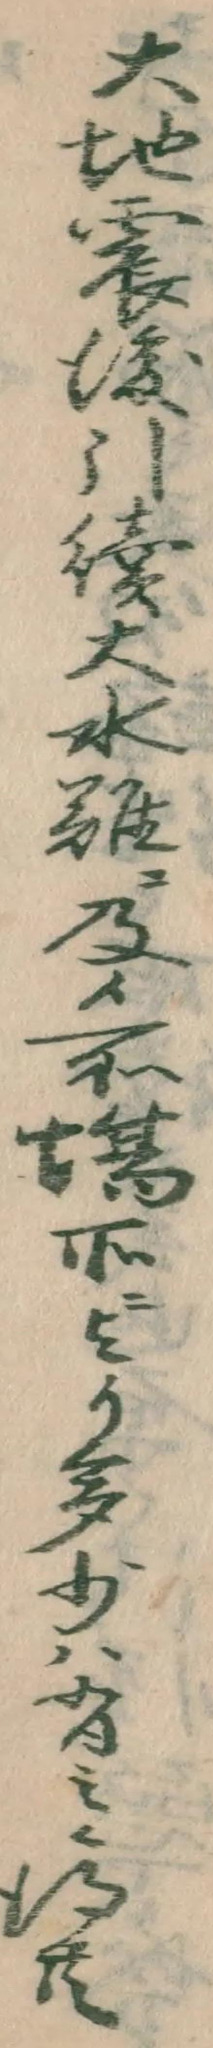大地震後引続大水難ニ及候所場所ニより多少は有之候得共
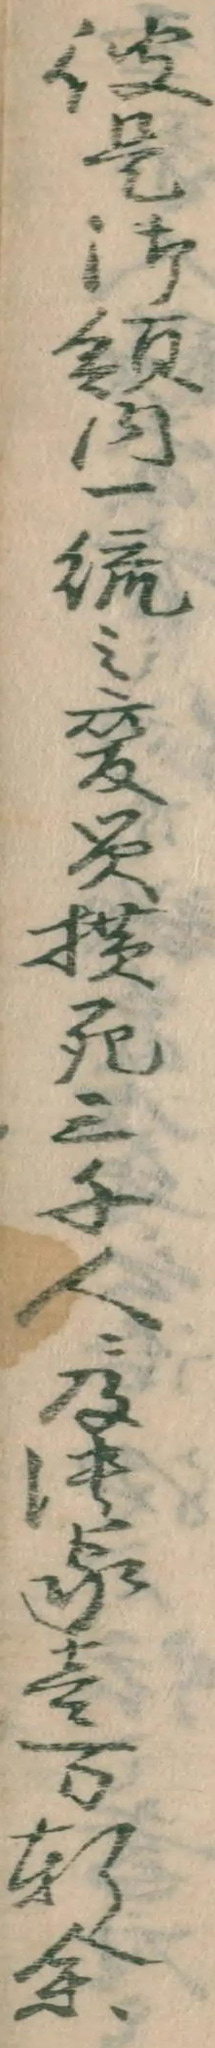彼是御領内一統之変災横死三千人ニ及潰家壱万軒余

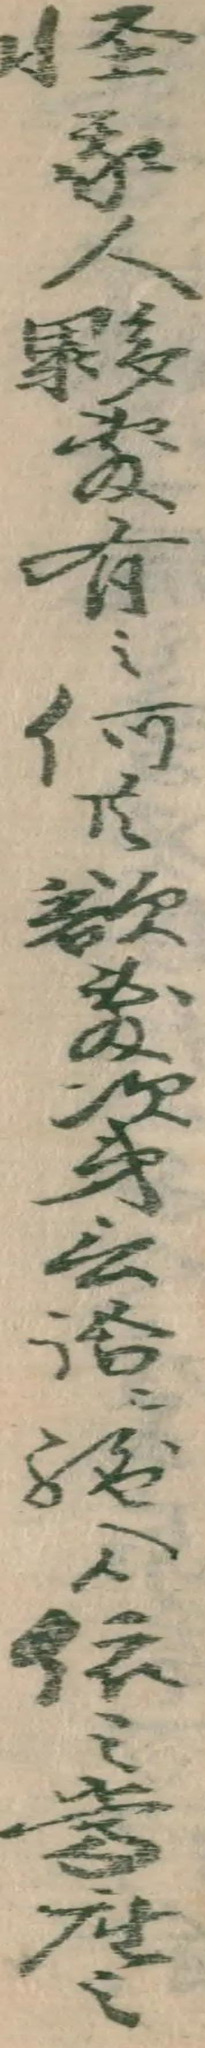怪我人夥敷有之何共歎敷次第言語ニ銘へ候依之当座之
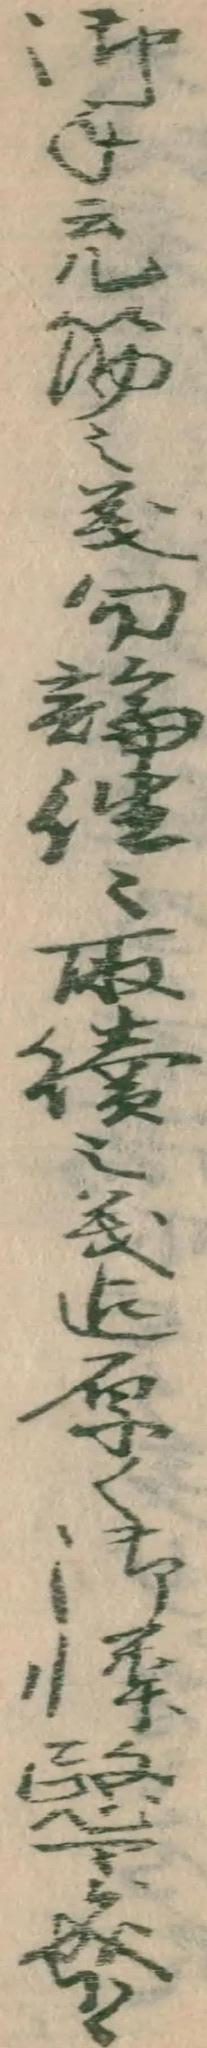御手充筋之義勿論往〻取続之義迄厚く御憐愍可被成下候
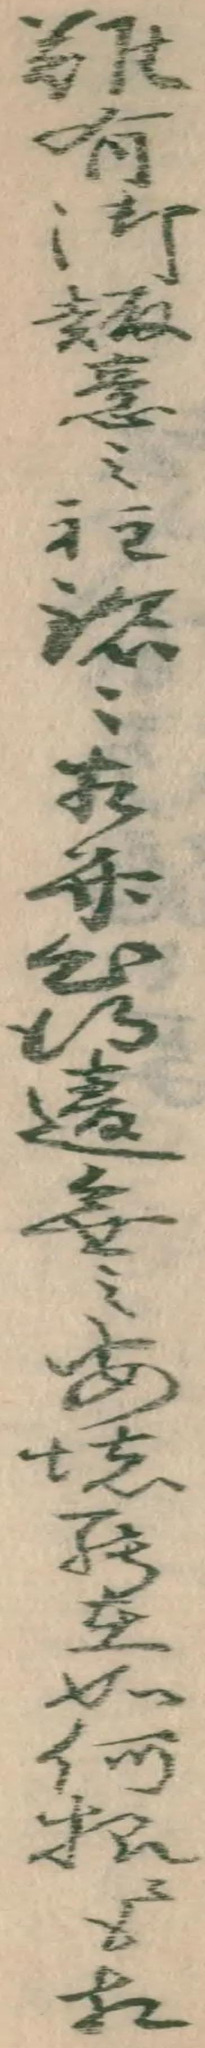難有御趣意之程銘〻相弁心得違無之安堵罷在如何様ニも相
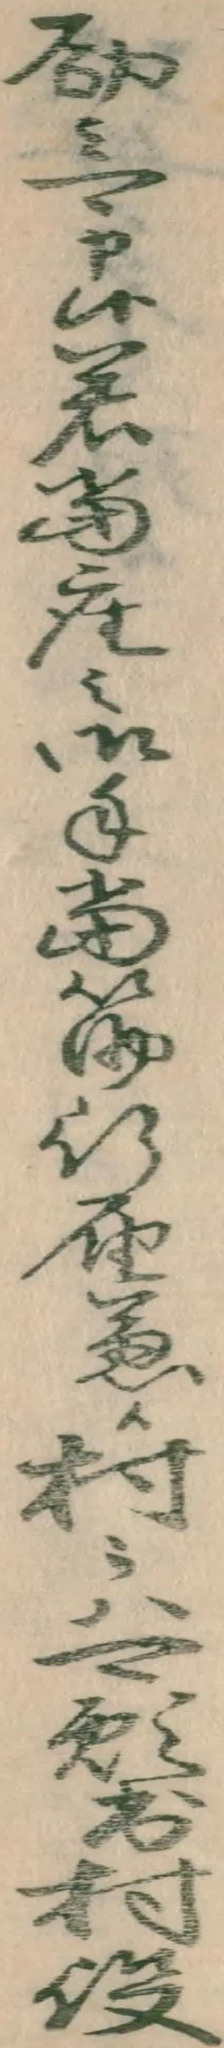励ミ可申候若当座之御手当筋行届兼候村〻は願出村役
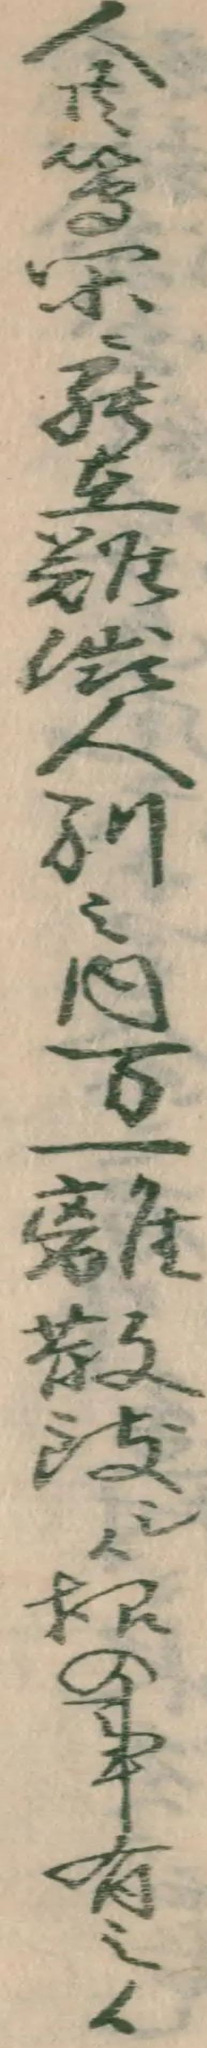人共等閑ニ罷在難渋人別之内万一離散致シ候様の事有之候
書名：大地震
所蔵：国立国会図書館 National Diet Library, JAPAN
